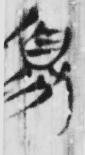須
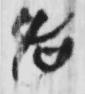左
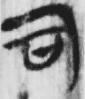司
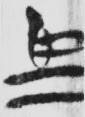馬
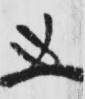之
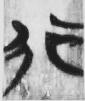行
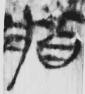𨟻（將）
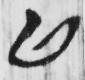㠯（以）
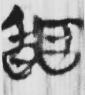○（聞）
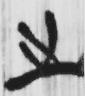之
